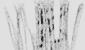好
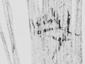凡
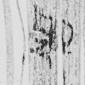色
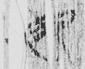母
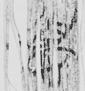○（憂）
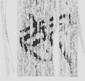母
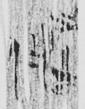○（佻）
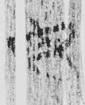母
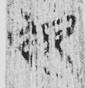母
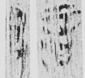○（搖）
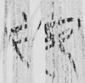母
